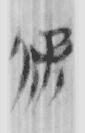保
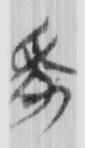{爪家}
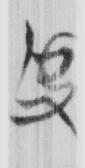沒
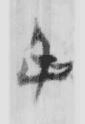身
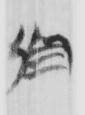於
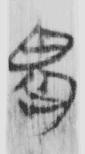畏
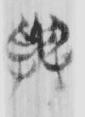與
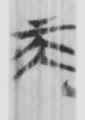天
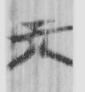亓
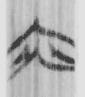亦
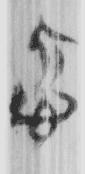忻
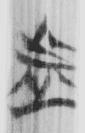者
